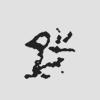{豆戈}
